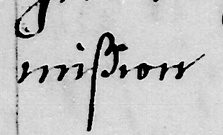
mißion
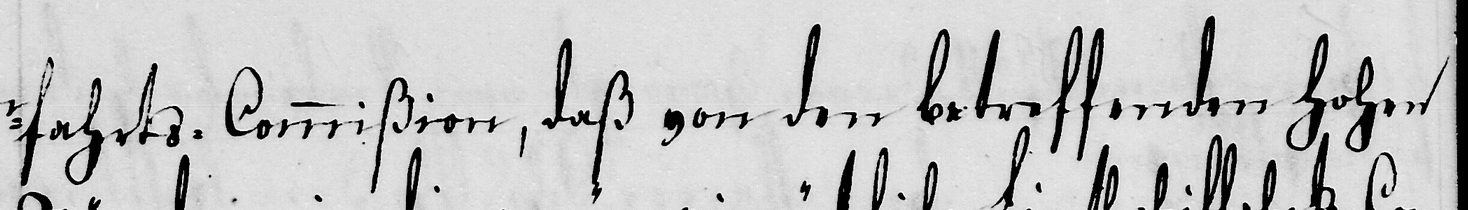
fahrts-Commißion, dass von den betreffenden Hohen
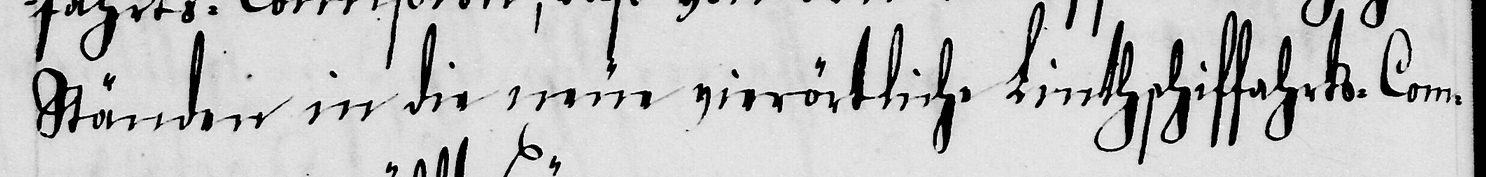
Ständen in die neue vierörtliche Linthschiffahrts-Com¬
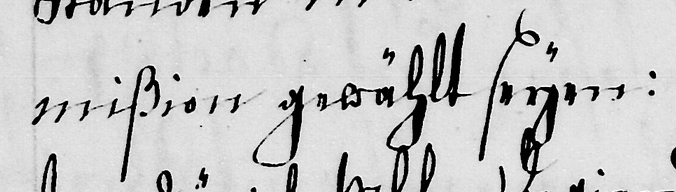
mißion gewählt seyen:
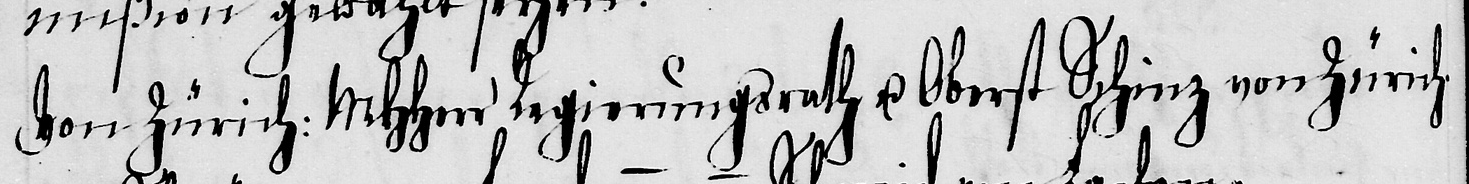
Von Zürich: MHHerr Regierungsrath & Oberst Schinz von Zürich
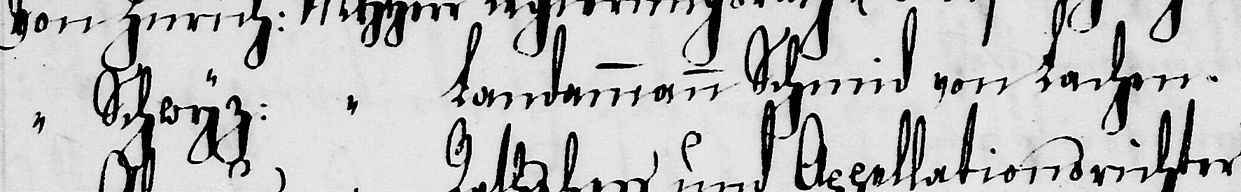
“ Schwyz: “ Landammann Schmid von Lachen.
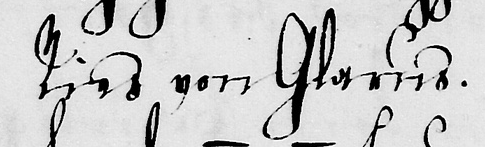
Ries von Glarus.
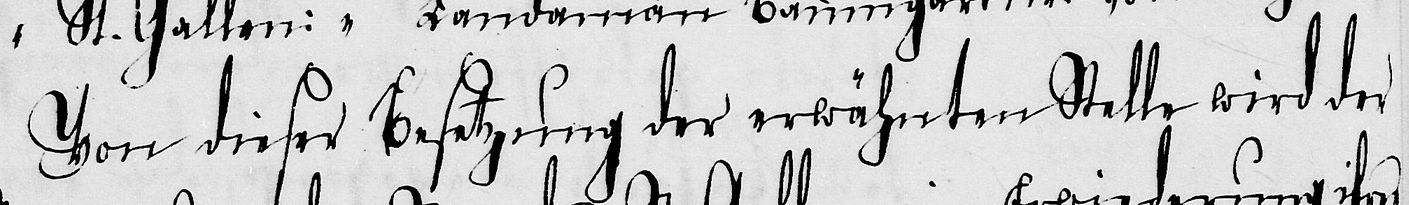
Von dieser Besetzung der erwähnten Stelle wird der
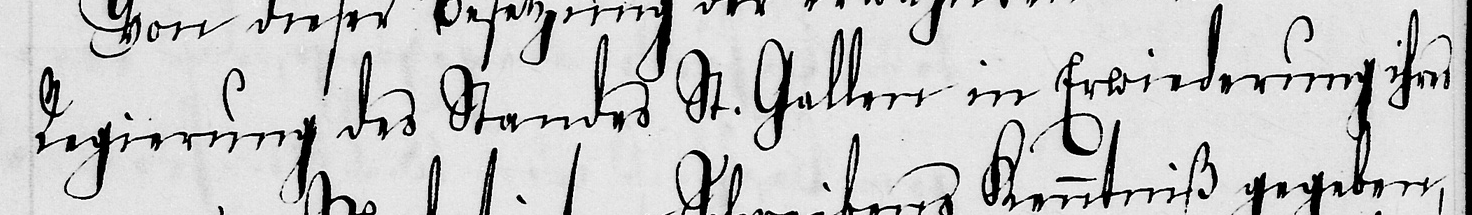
Regierung des Standes St. Gallen in Erwiederung ihr¬
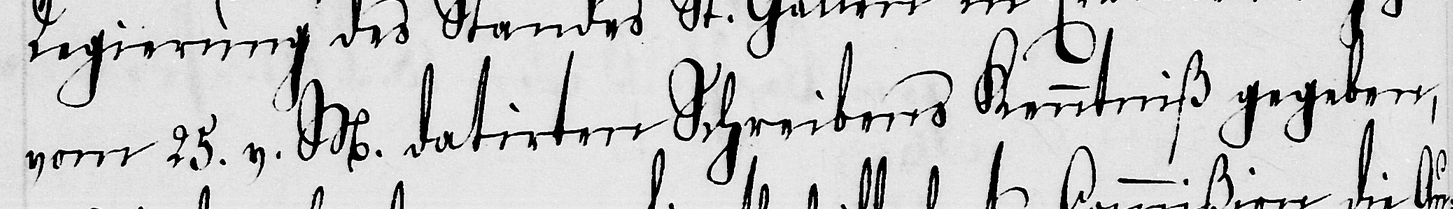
vom 25. v. M. datirten Schreibens Kenntniß gegeben,
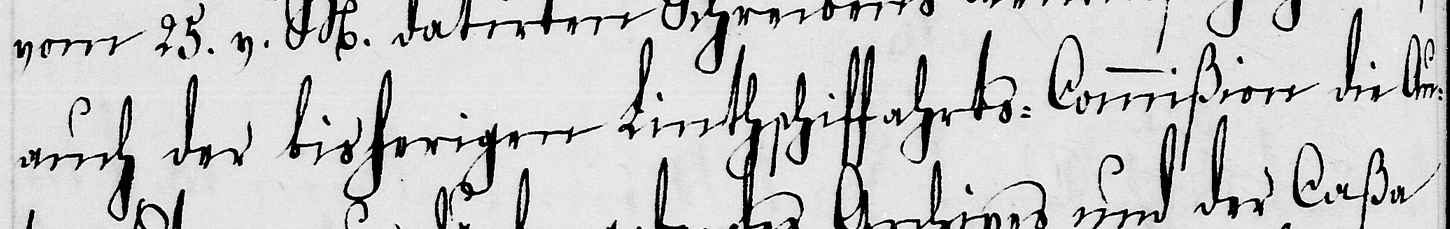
auch der bisherigen Linthschiffahrts-Commißion die
